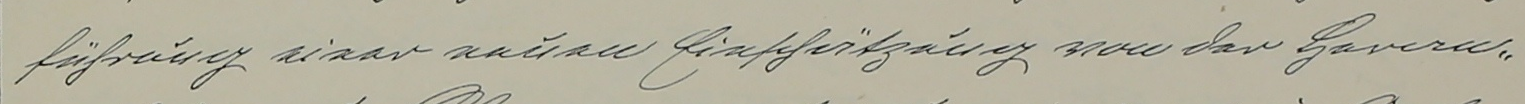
führung einer neuen Einschätzung von der Heran-
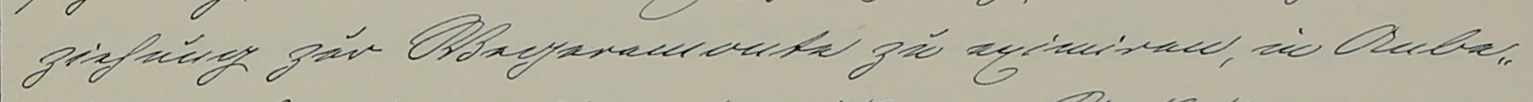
ziehung zur Wegeremonte zu eximiren, in Anbe-
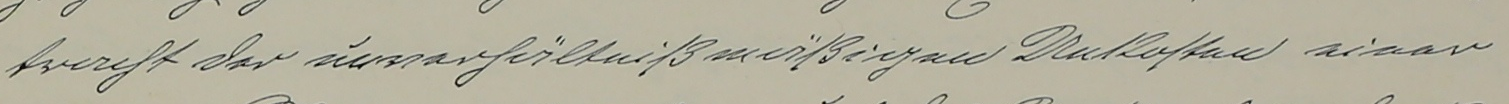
tracht der unverhältnißmäßigen Unkosten einer
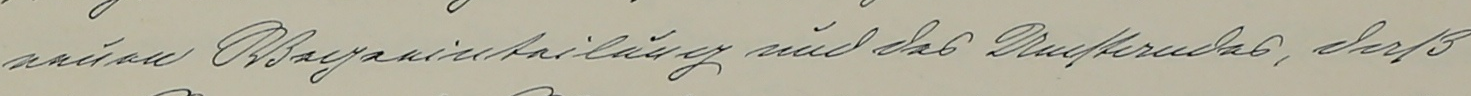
neuen Wegeeinteilung und des Umstandes, daß
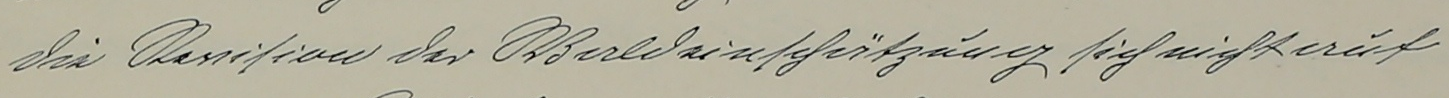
die Revision der Waldeinschätzung sich nicht auf
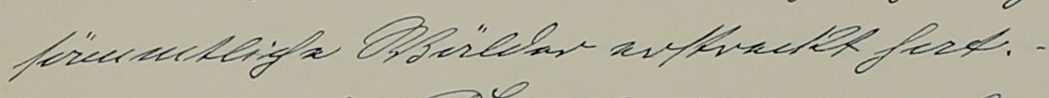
sämtliche Wälder erstreckt hat.
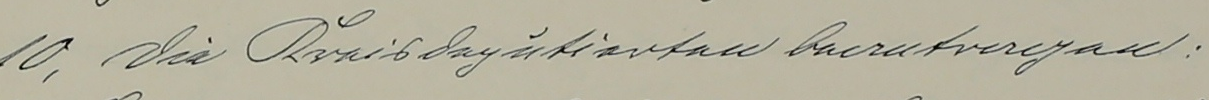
10. Die Kreisdeputierten beantragen:
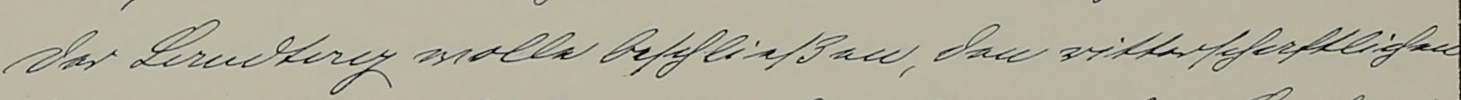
Der Landtag wolle beschließen, den ritterschaftlichen
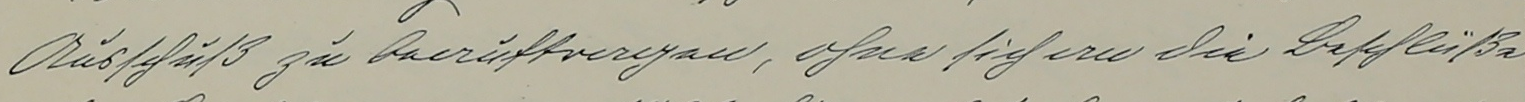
Ausschuß zu beauftragen, ohne sich an die Beschlüße
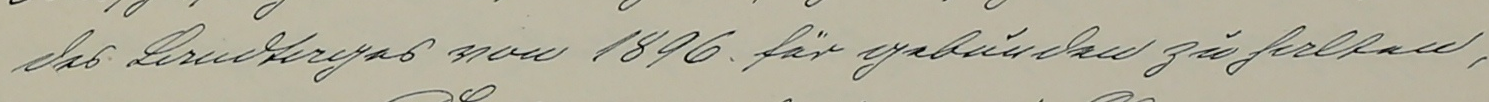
des Landtages von 1896. für gebunden zu halten,
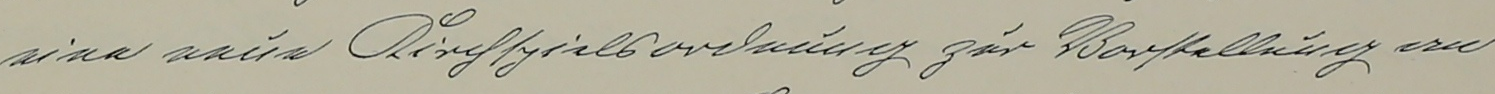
eine neue Kirchspielsordnung zur Vorstellung an
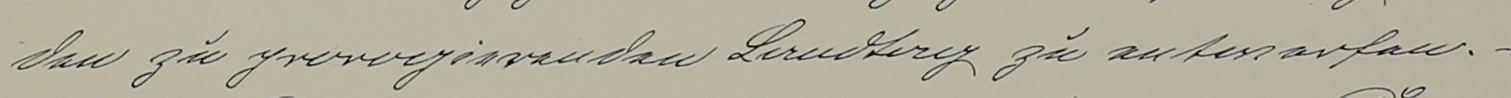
den zu prorogierenden Landtag zu entwerfen.
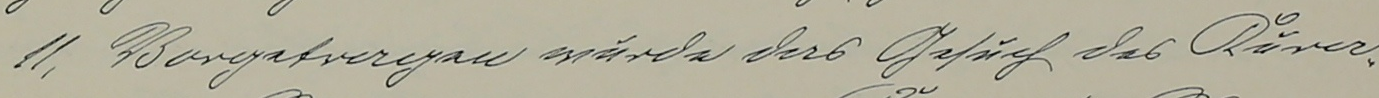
11. Vorgetragen wurde das Gesuch des Kura-
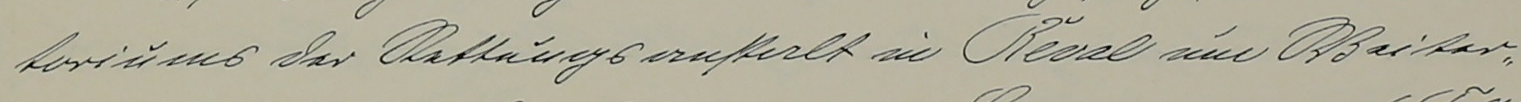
toriums der Rettungsanstalt in Reval um Weiter-
